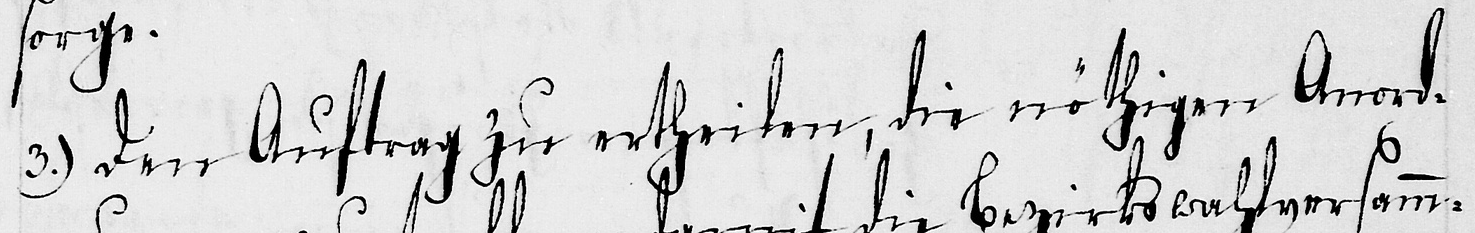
3.) Den Auftrag zu ertheilen, die nöthigen Anord¬
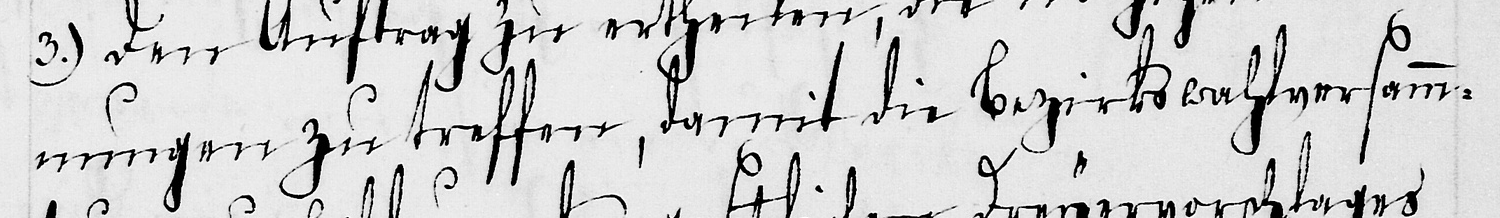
nungen zu treffen, damit die Bezirkswahlversamm¬
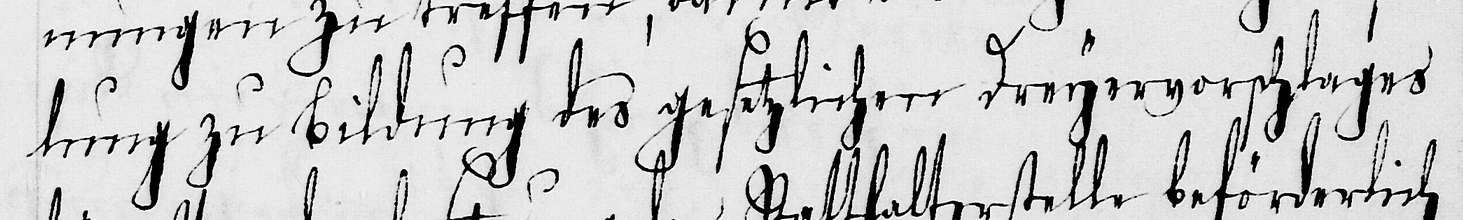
lung zu Bildung des gesetzlichen Dreyervorschlages
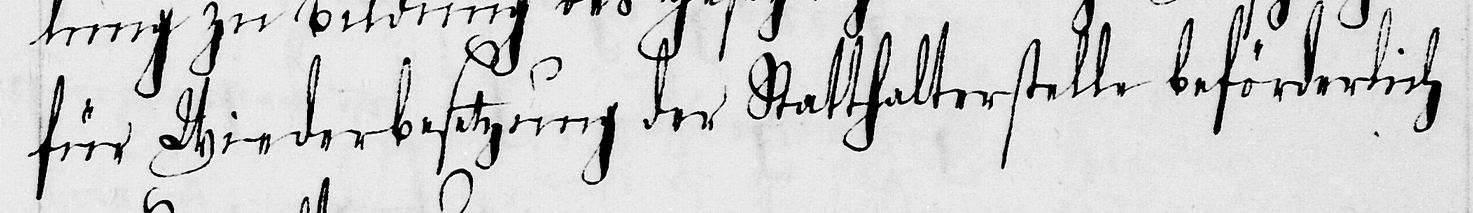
für Wiederbesetzung der Statthalterstelle beförderlich
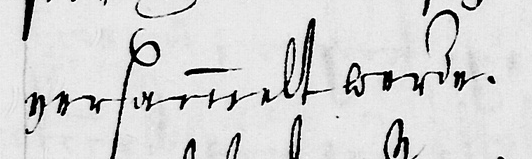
versammelt werde.
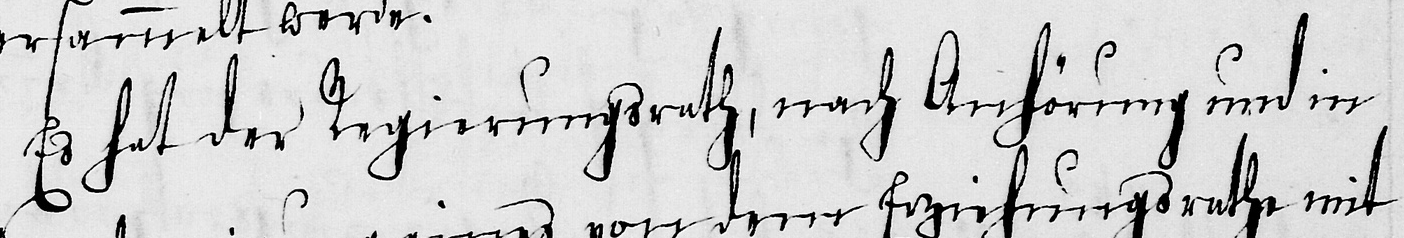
Es hat der Regierungsrath, nach Anhörung und in
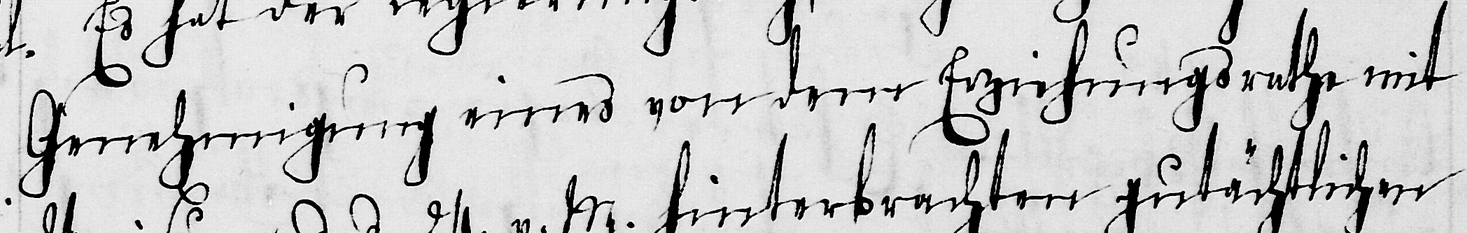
Genehmigung eines von dem Erziehungsrathe mit
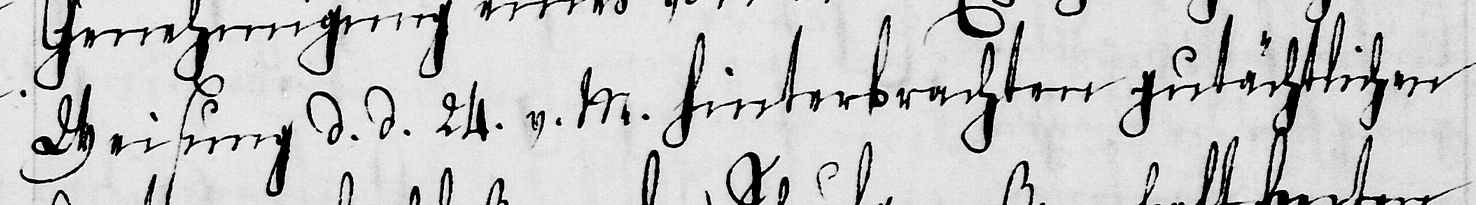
Weisung d. d. 24. v. M. hinterbrachten gutächtlichen
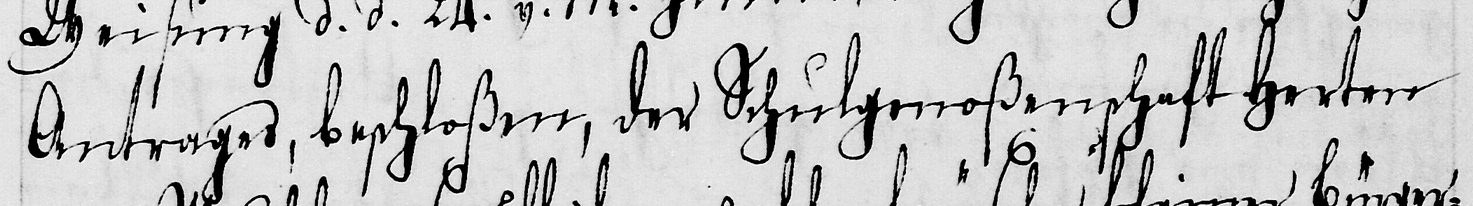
Antrages, beschloßen, der Schulgenoßenschaft Herten
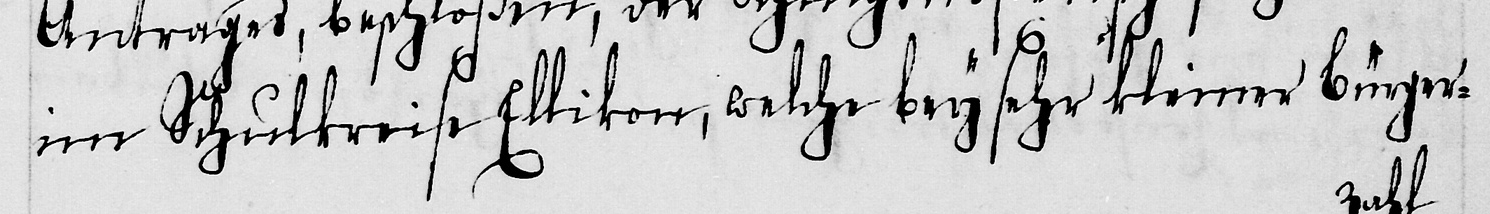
im Schulkreise Ellikon, welche bey sehr kleiner Bürger-
